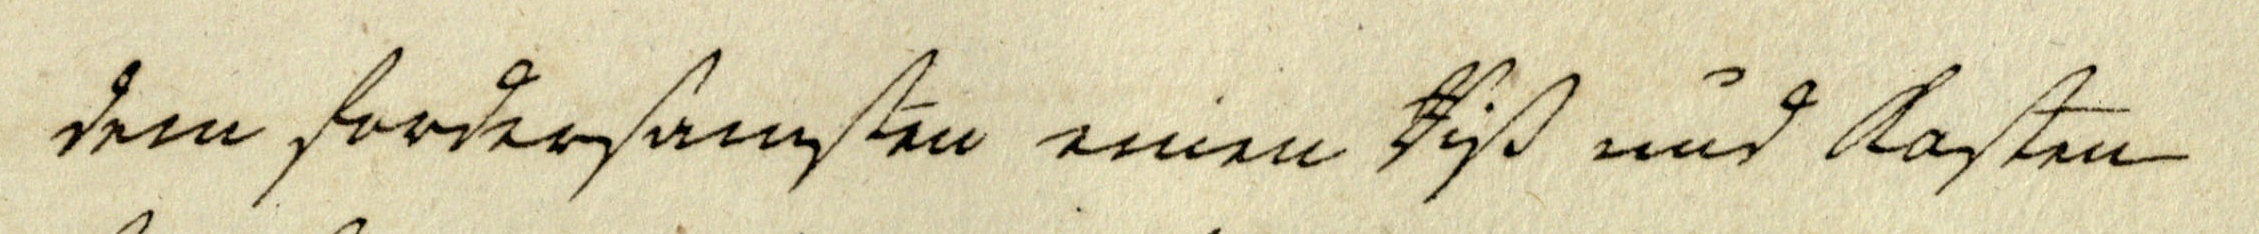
dem fordersamsten einen Riß und Kosten¬
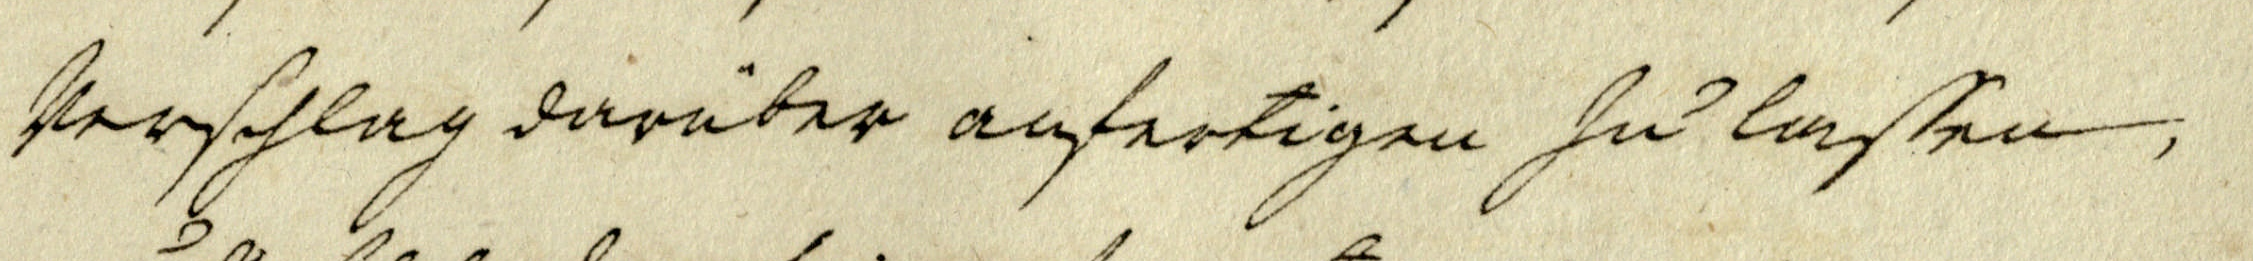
Verschlag darüber anfertigen zu lassen,
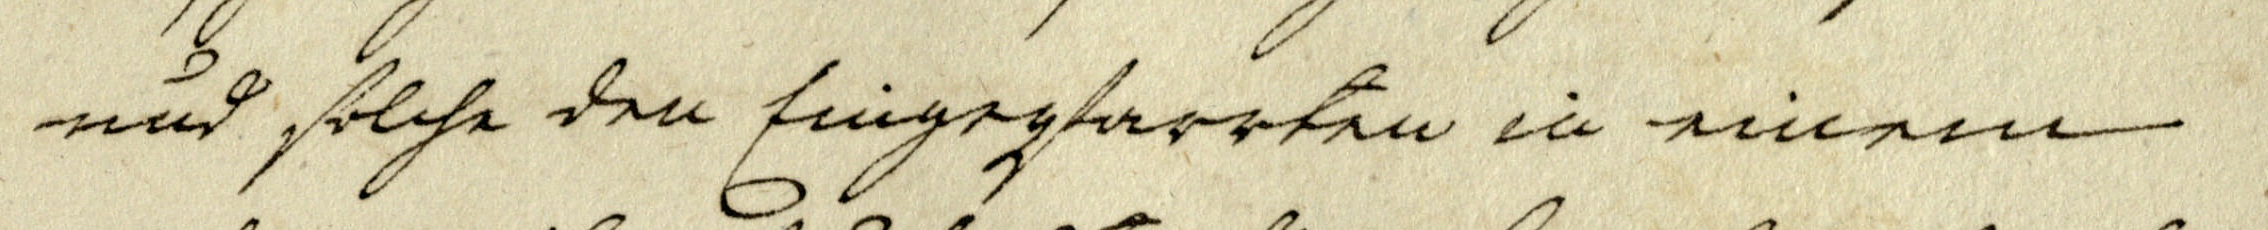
und solche den Eingepfarrten in einem
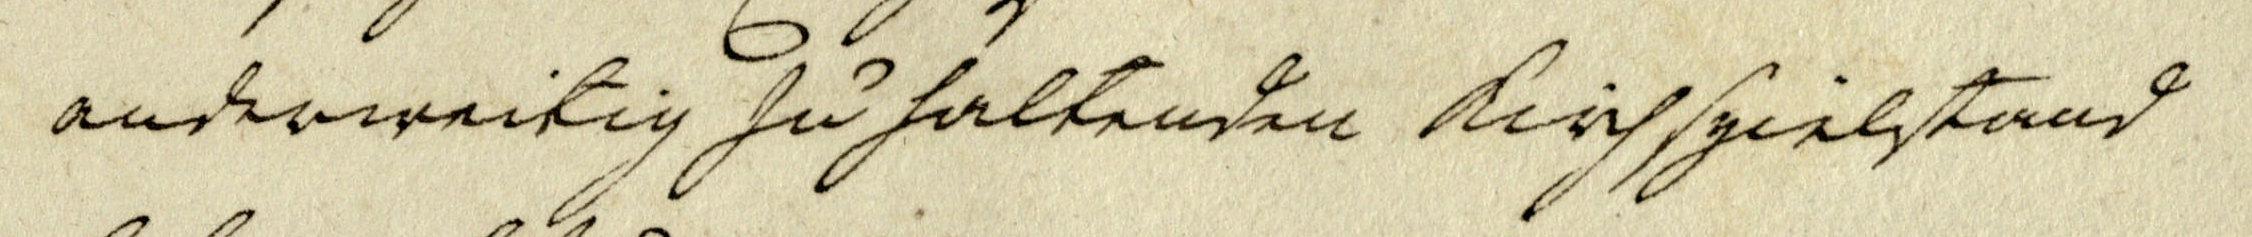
anderweitig zu haltenden Kirchspielstand
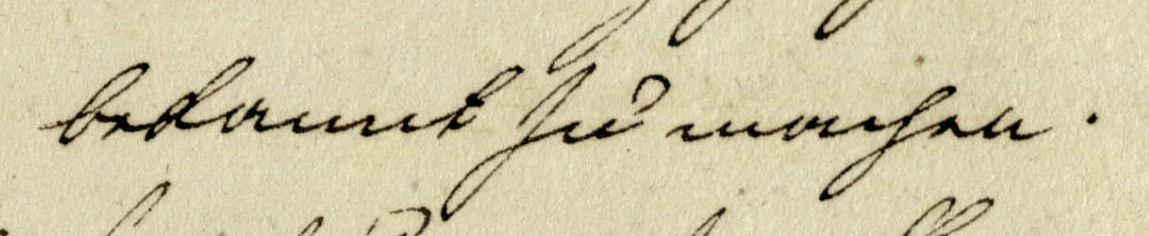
bekannt zu machen.
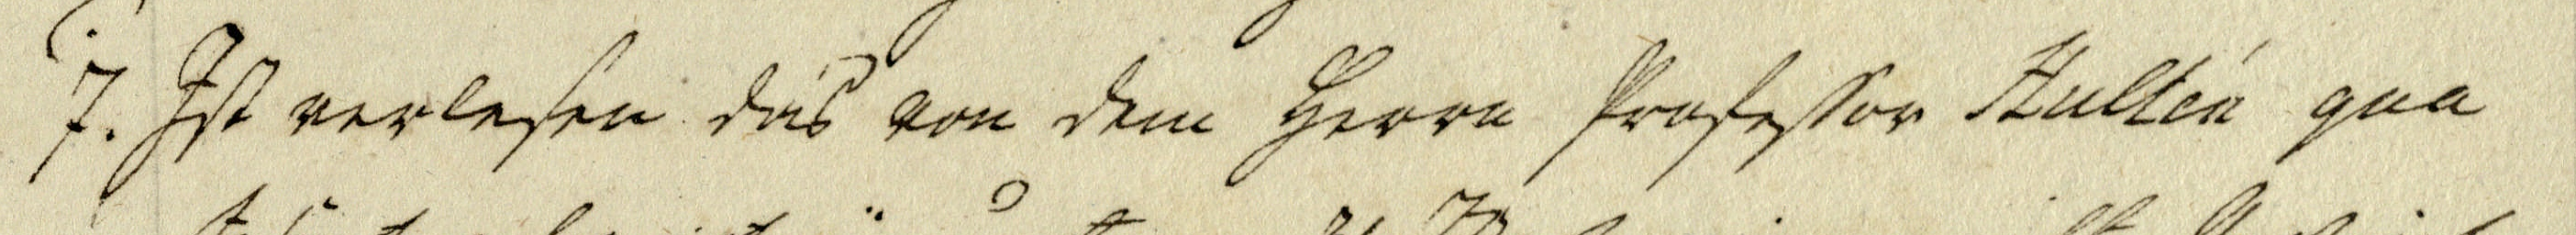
7. Ist verlesen das von dem Herrn Professor Hultén qua
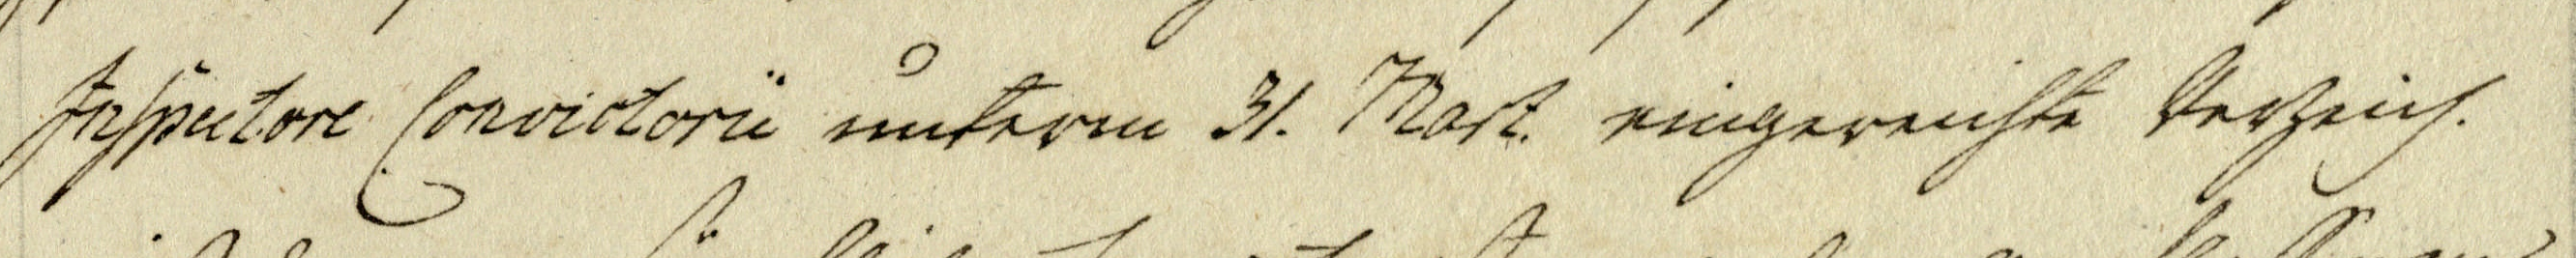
Inspectore Convictorii unterm 31. Mart. eingereichte Verzeich¬
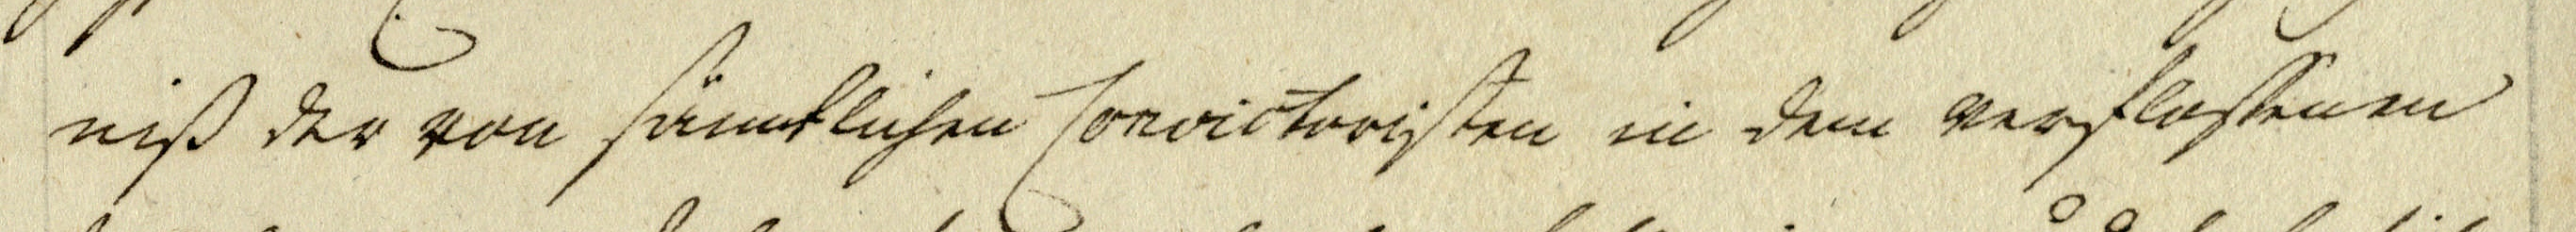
niß der von sämtlichen Convictoristen in dem verflossenen
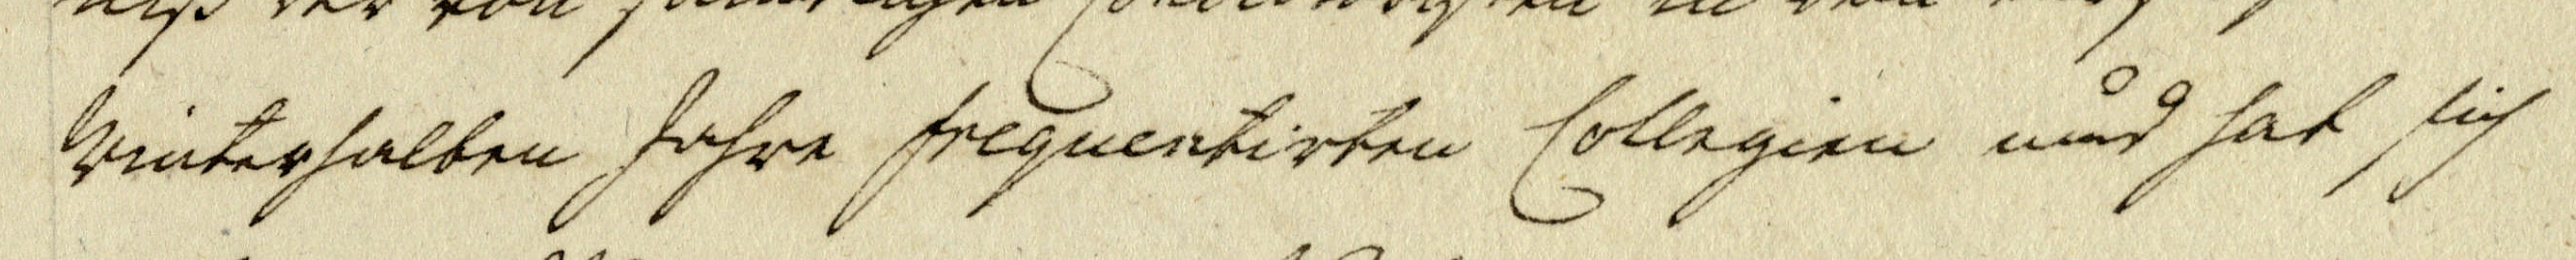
Winterhalben Jahre frequentirten Collegien und hat sich
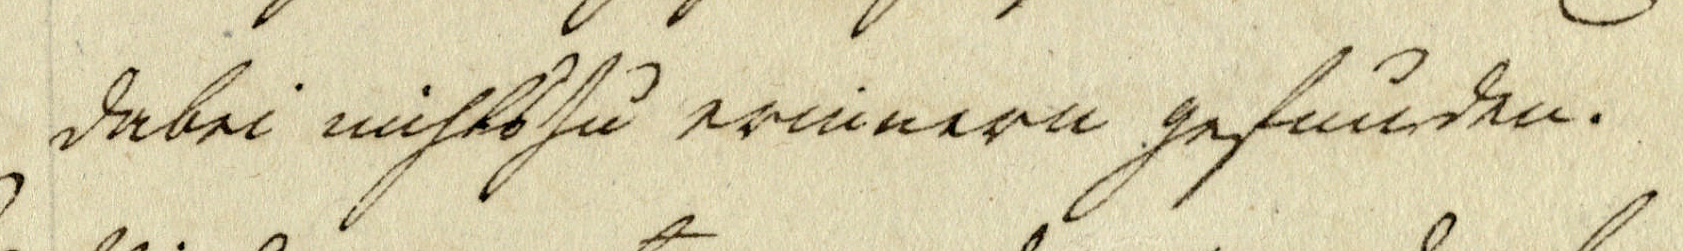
dabei nichts zu erinnern gefunden.
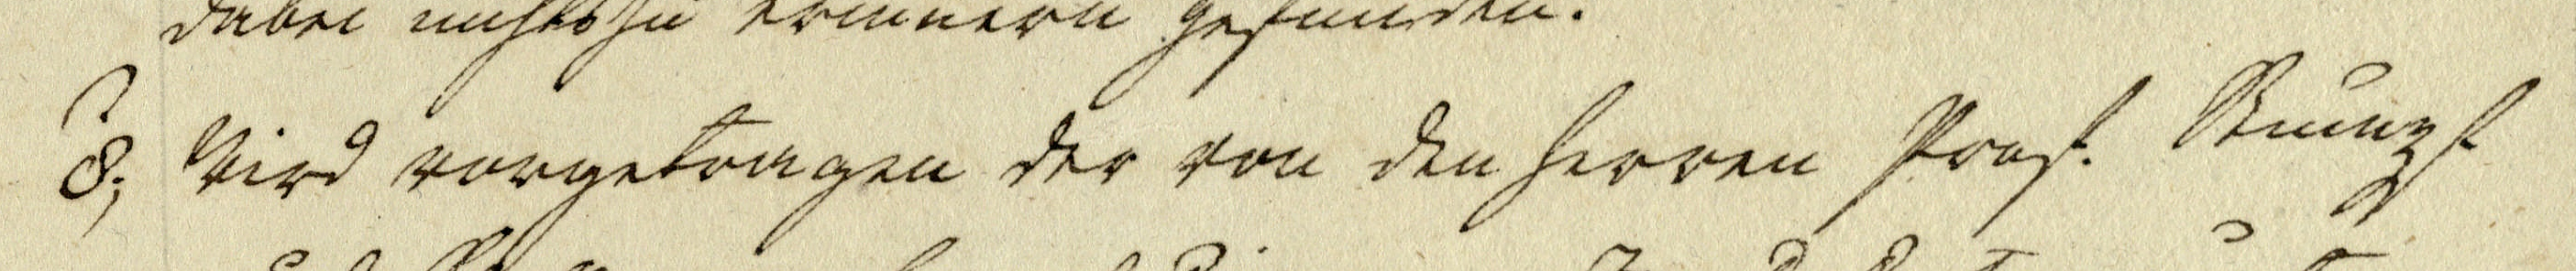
8., Wird vorgetragen der von den Herren Prof. Stumpf
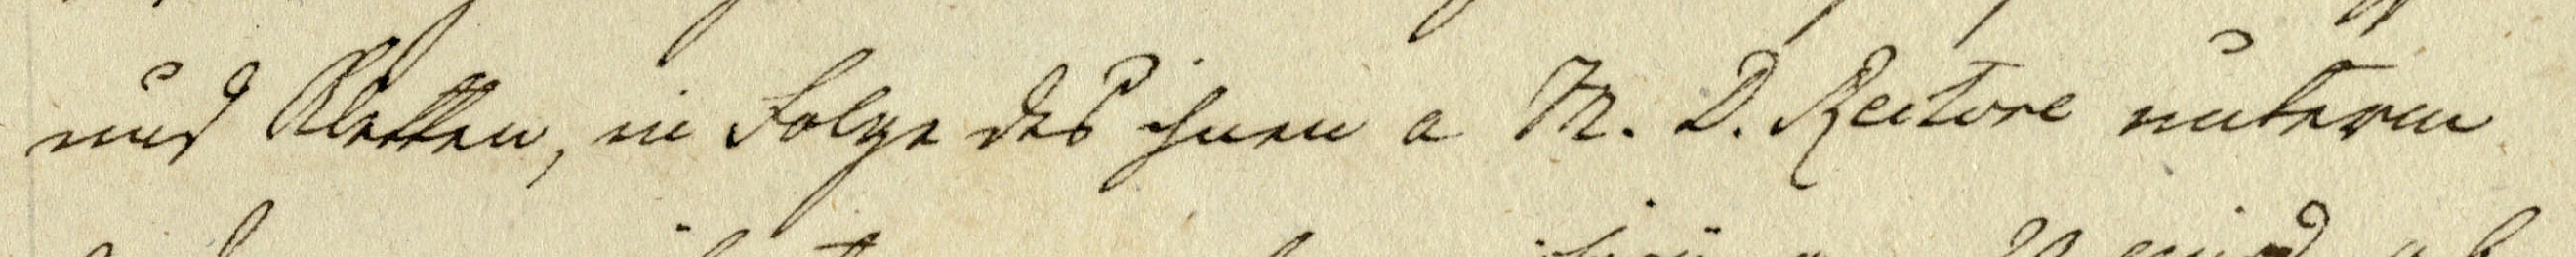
und Kletten, in Folge des ihnen a M. D. Rectore unterm
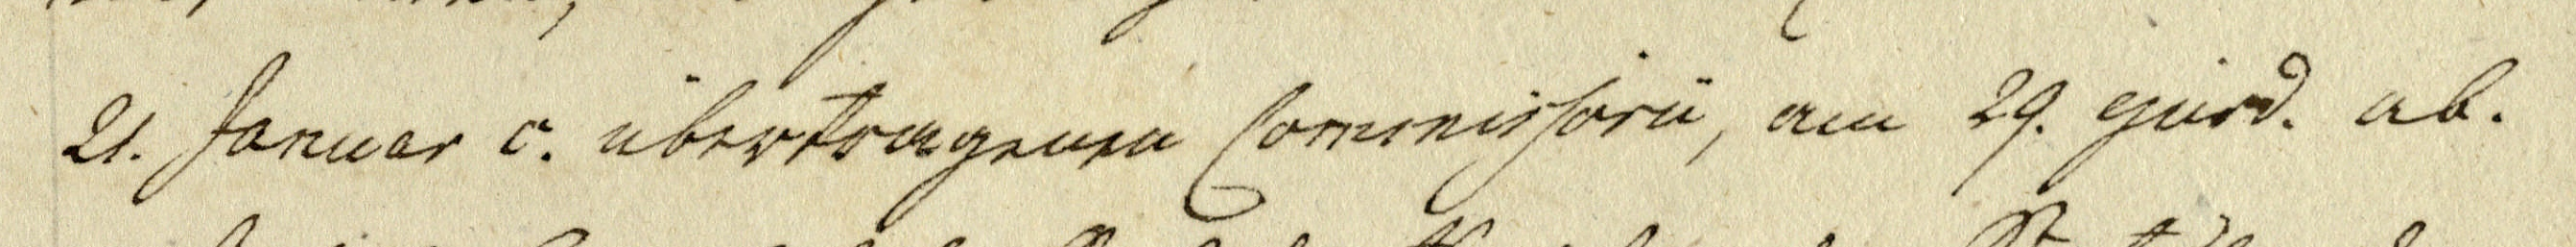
21. Januar c. übertragenen Commissorii, am 29. ejusd. ab¬
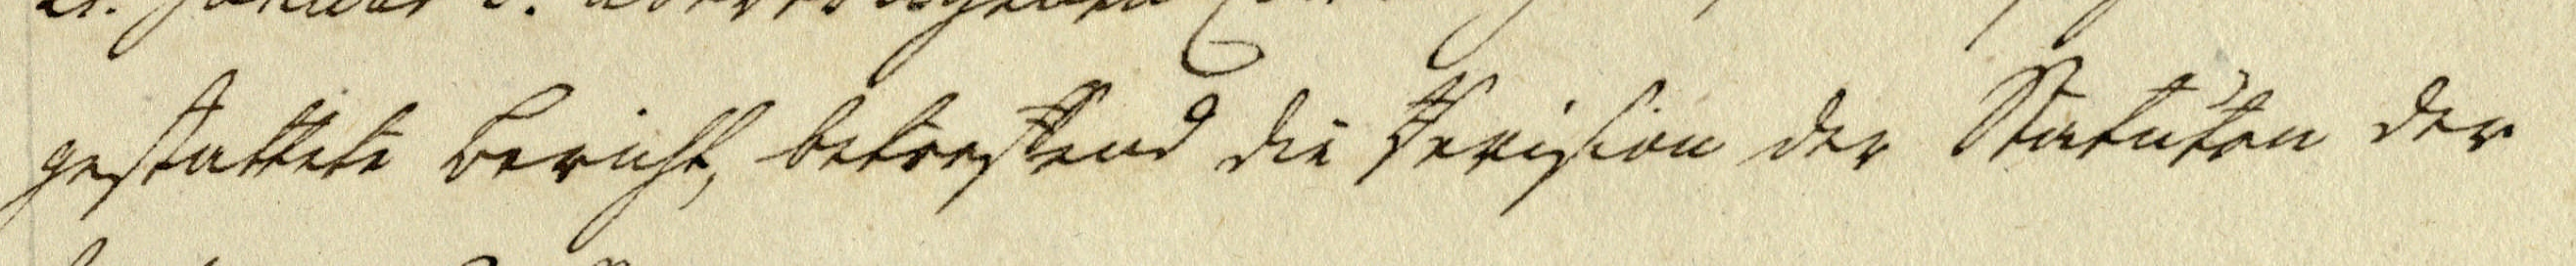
gestattete Bericht, betreffend die Revision der Statuten der
